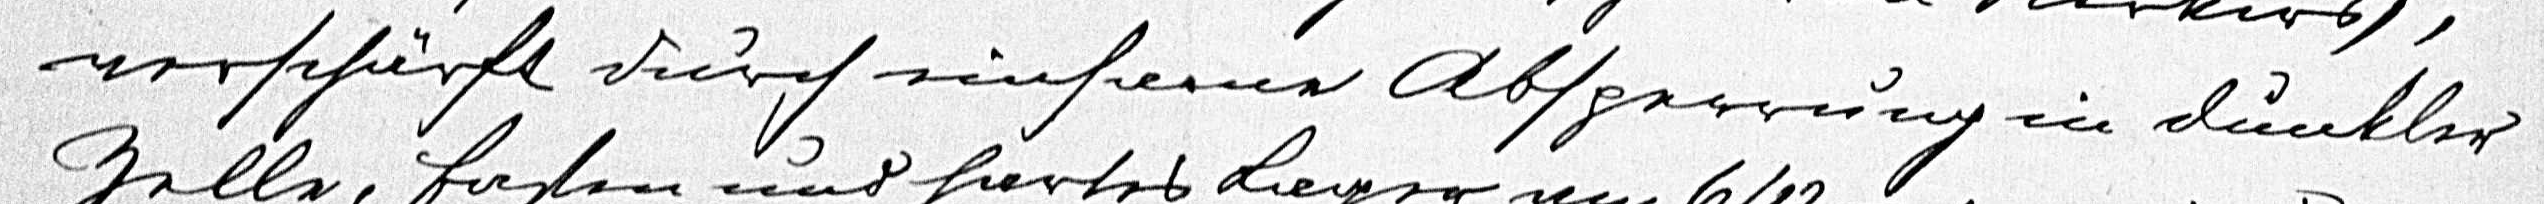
verschärft durch einsame Absperrung in dunkler
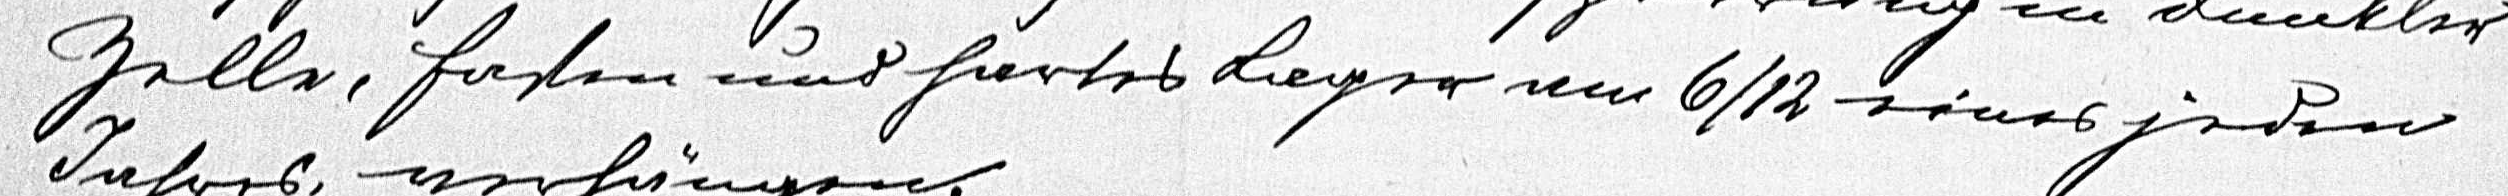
Zelle, fasten und Hartes Lager am 6/12 eines jeden
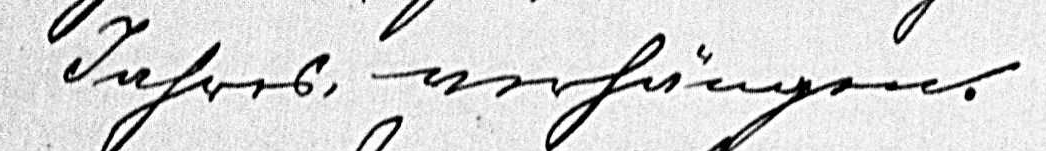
Jahres, verhängen.
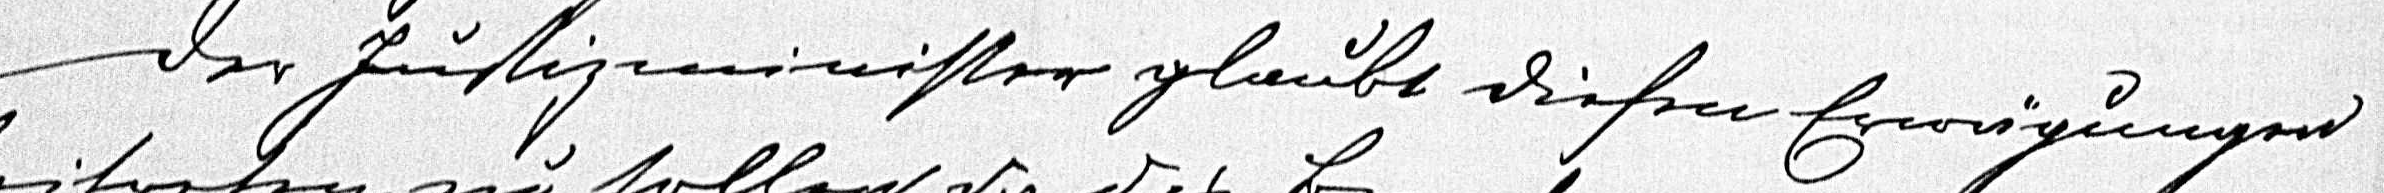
Der Justizminister glabut diesen Erwägungen
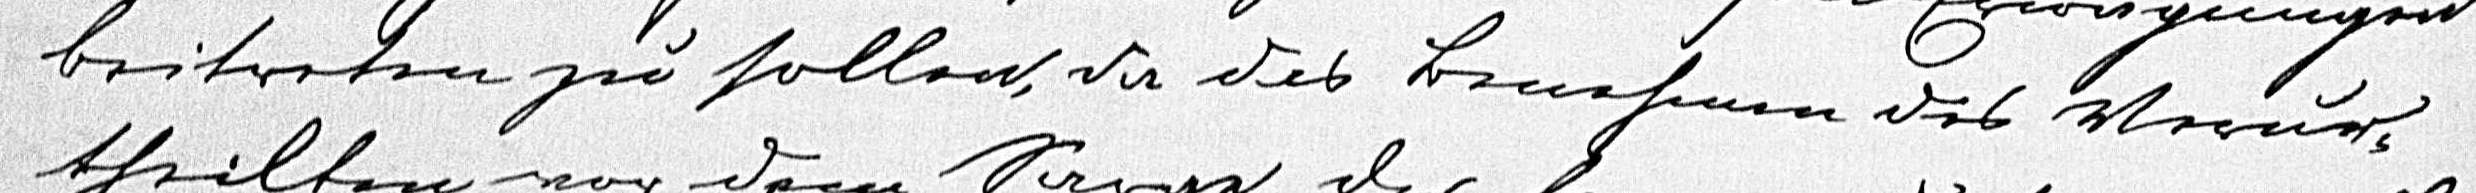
beitreten zu sollen, da das Benehmen des Verur¬
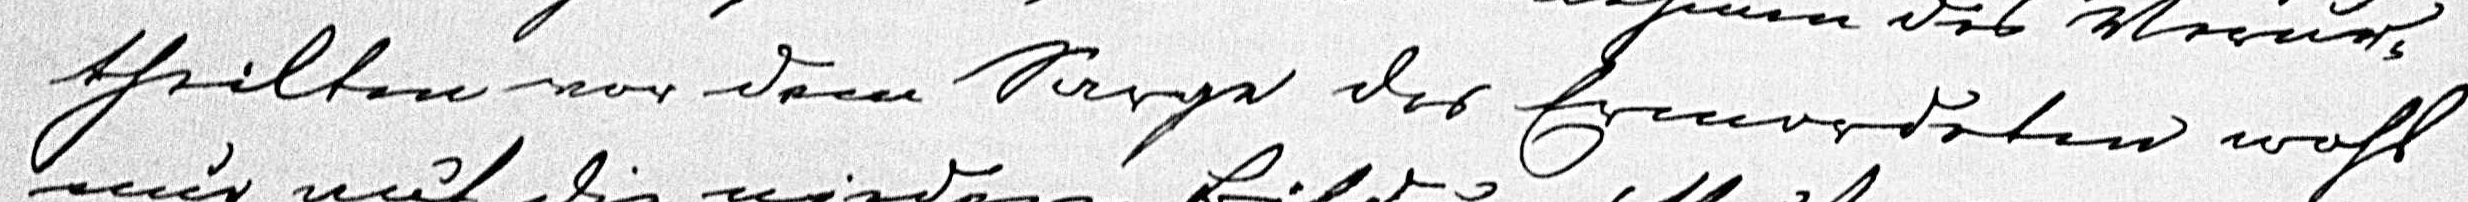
theilten vor dem Sarge des Ermordeten wohl
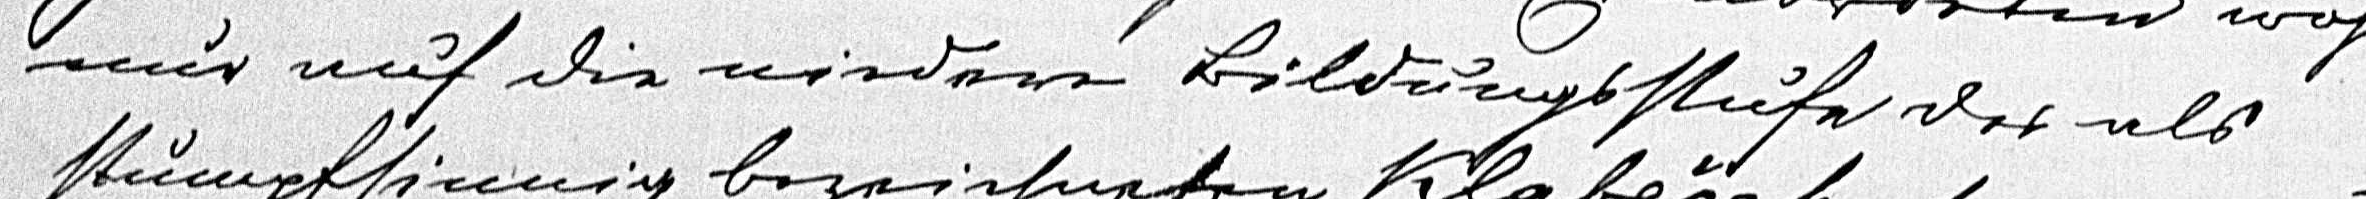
nur auf die niedere Bildungsstufe des als
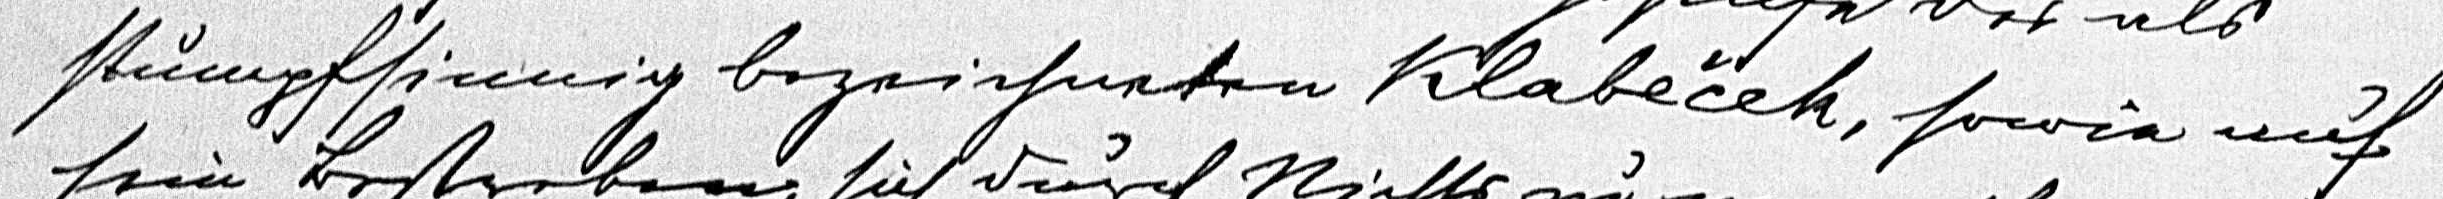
stumpfsinnig bezeichneten Klabeček, sowie auf
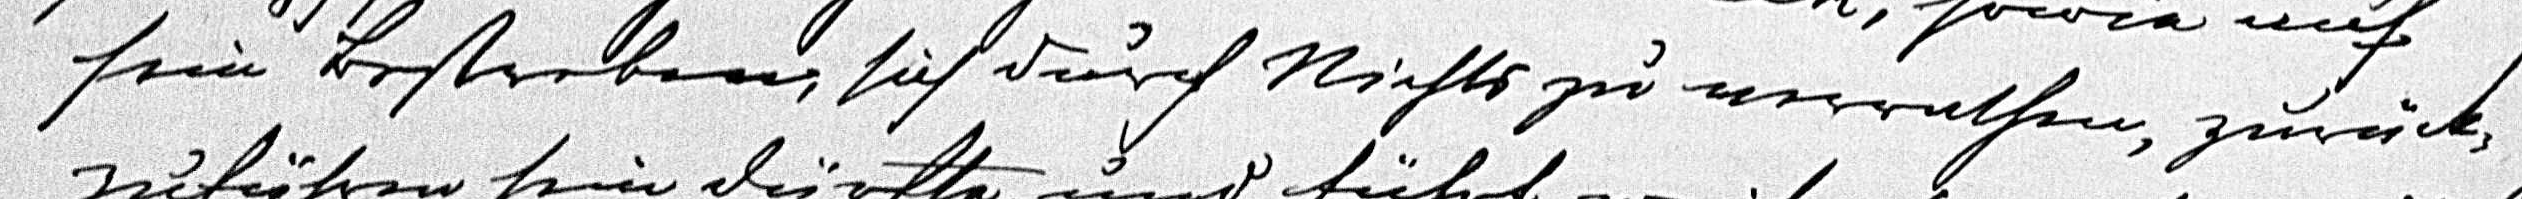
sein Bestreben, sich durch Nichts zu verrathen, zurück¬
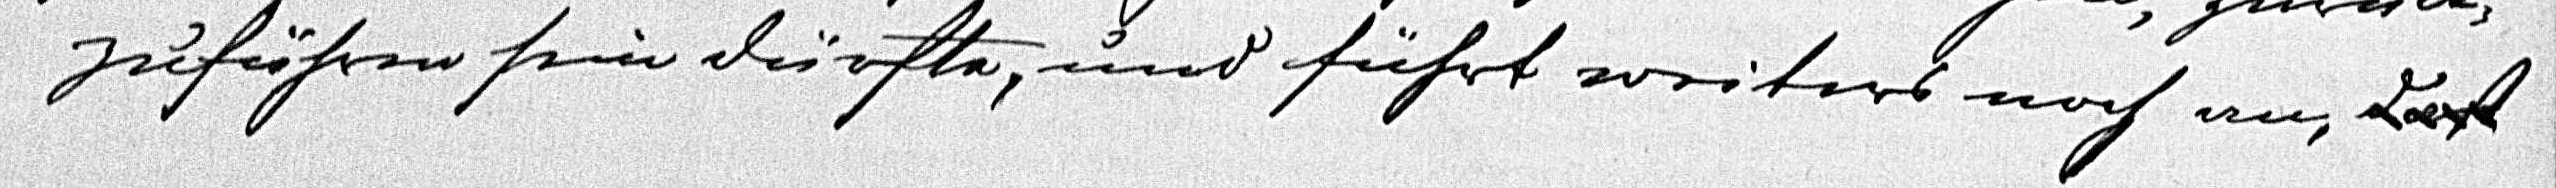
zuführen sein dürfte, und führt weiters noch an,
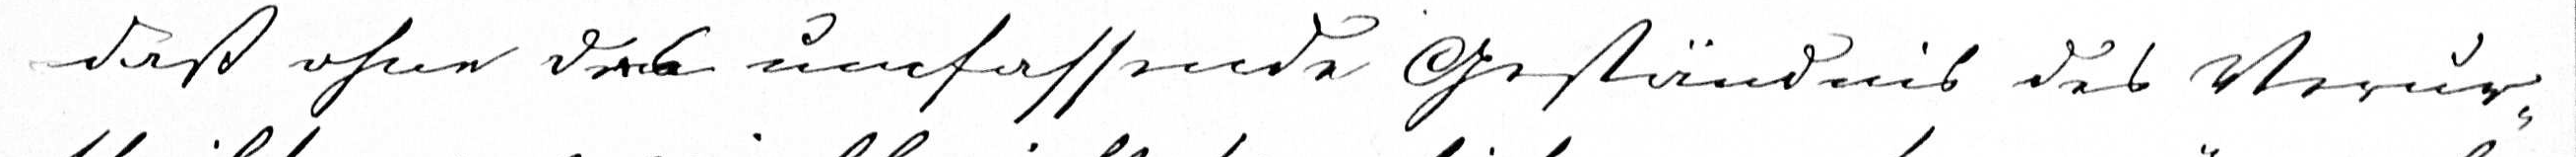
daß ohne das umfassende Geständnis des Verur¬
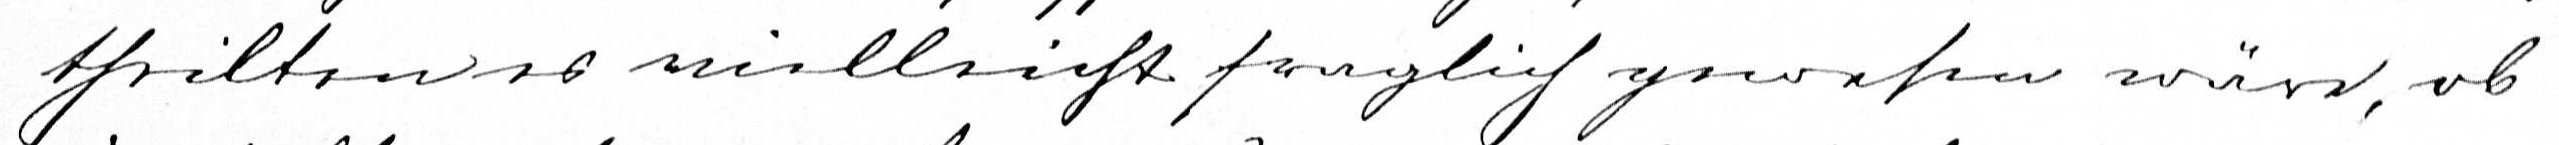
theilten es vielleicht fraglich gewesen wäre, ob
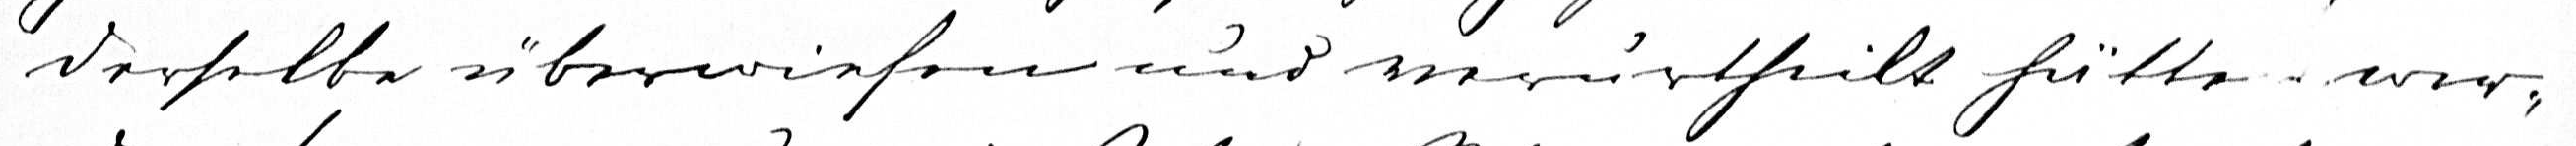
derselbe überwiesen und verurtheilt hätte wer¬
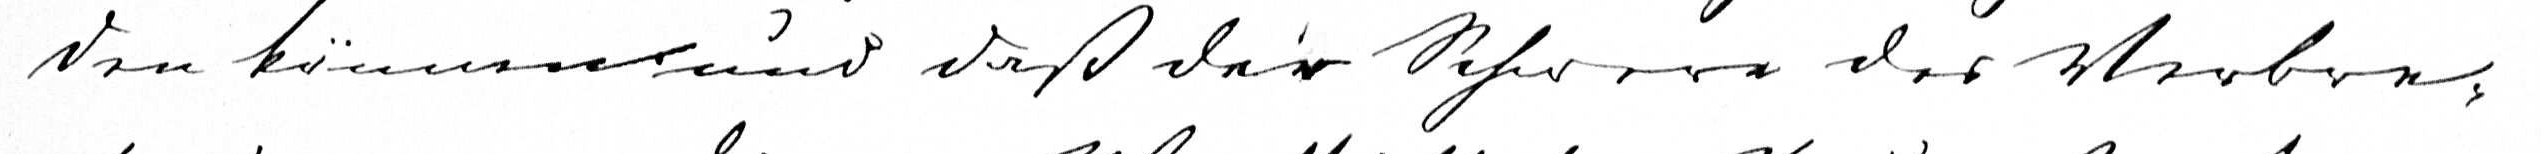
den können und daß der schwere des Verbre¬
